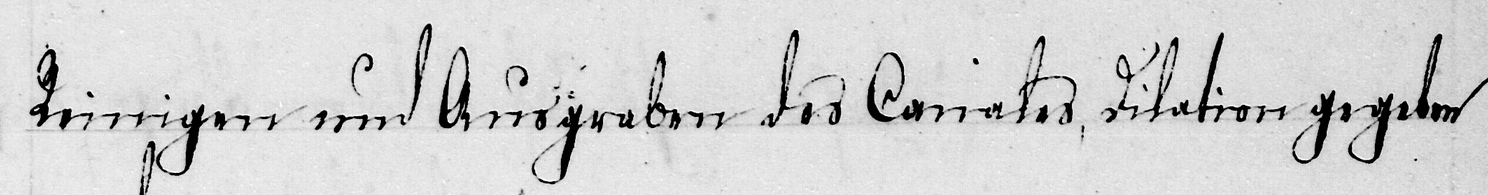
Reinigen und Ausgraben des Canals, Dilation gegeben
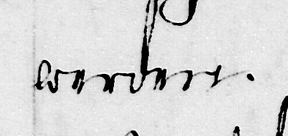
werden.
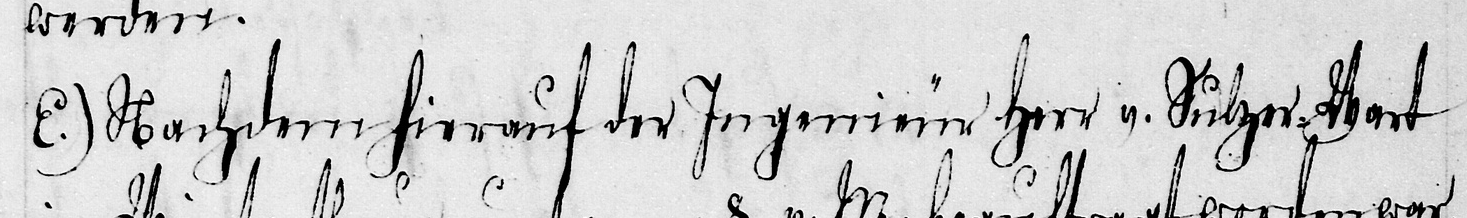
E.) Nachdem hierauf der Ingenieur Herr v. Sulzer-Wart
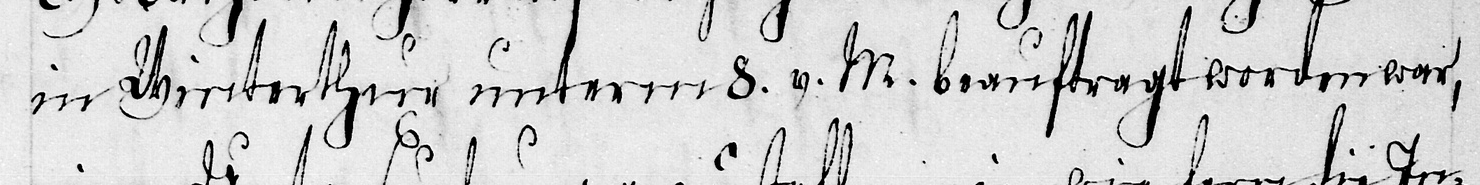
in Winterthur unterm 8. v. M. beauftragt worden war,
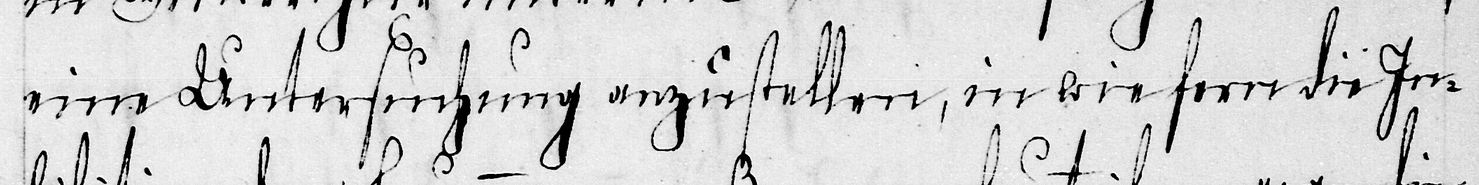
eine Untersuchung anzustellen, in wie fern die In¬
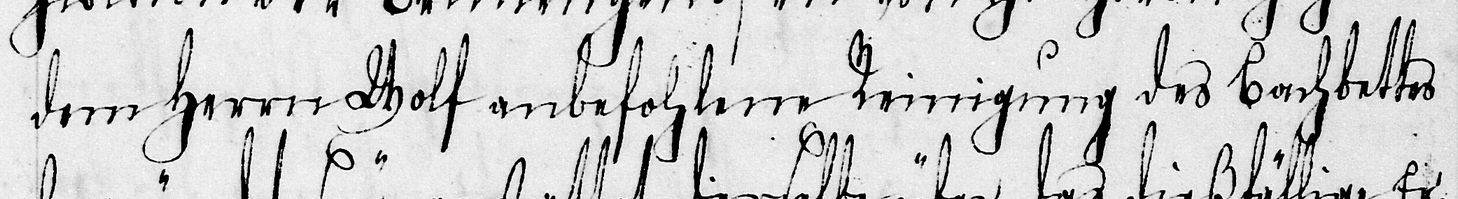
dem Herren Wolf anbefohlene Reinigung des Bachbettes
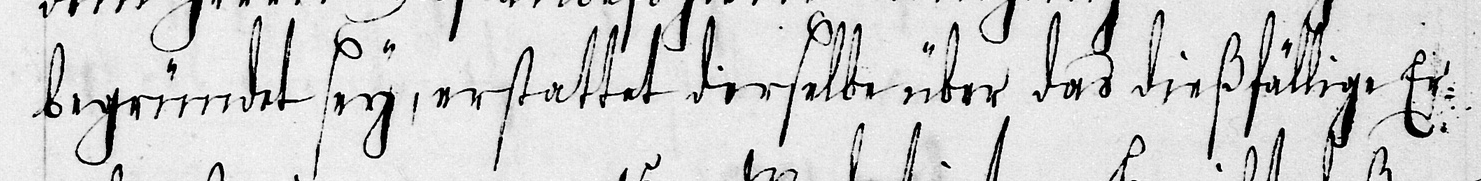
begründet sey, erstattet derselbe über das dießfällige Er¬
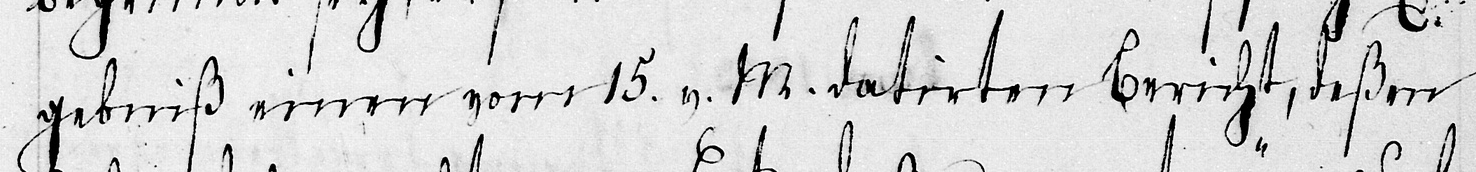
gebniß einen vom 15. v. M. datirten Bericht, deßen
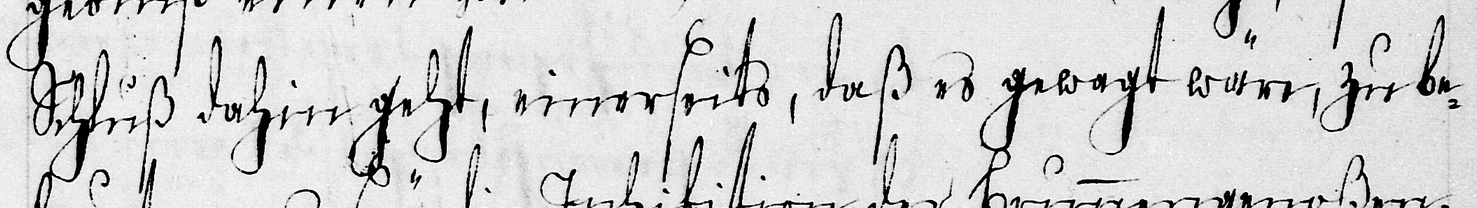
Schluß dahin geht, einerseits, daß es gewagt wäre, zu be¬
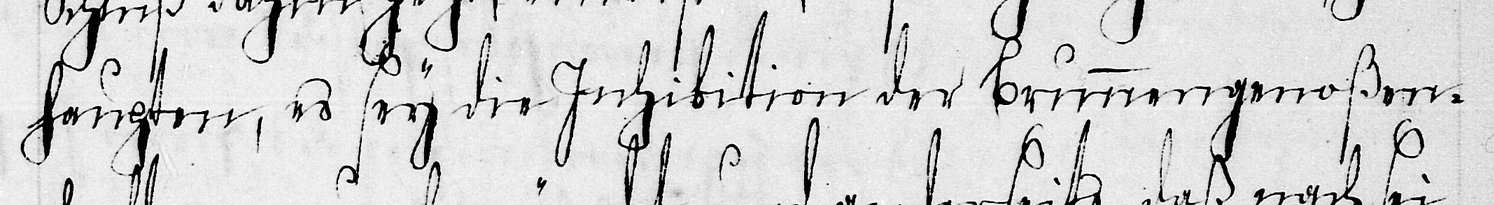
haupten, es sey die Inhibition der Brunnengenoßen¬
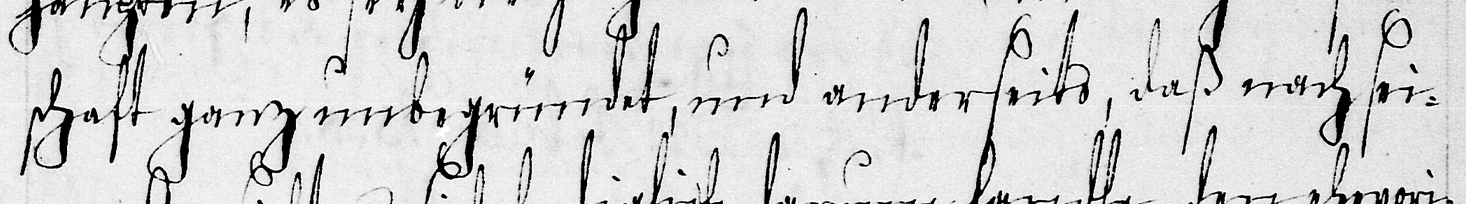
schaft ganz unbegründet, und anderseits, daß nach sei¬
